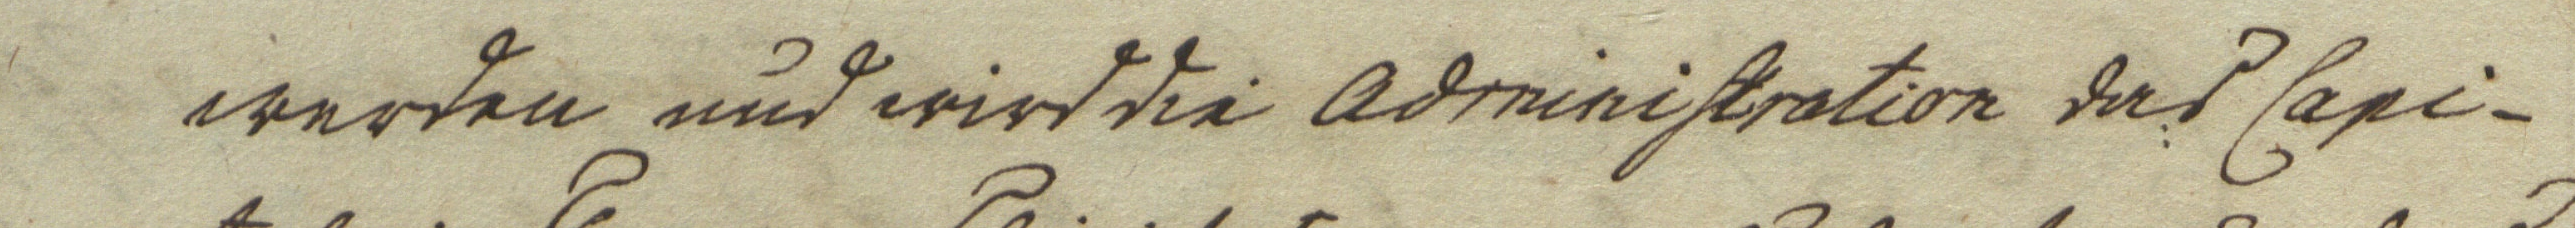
werden und wird die Administration das Capi¬
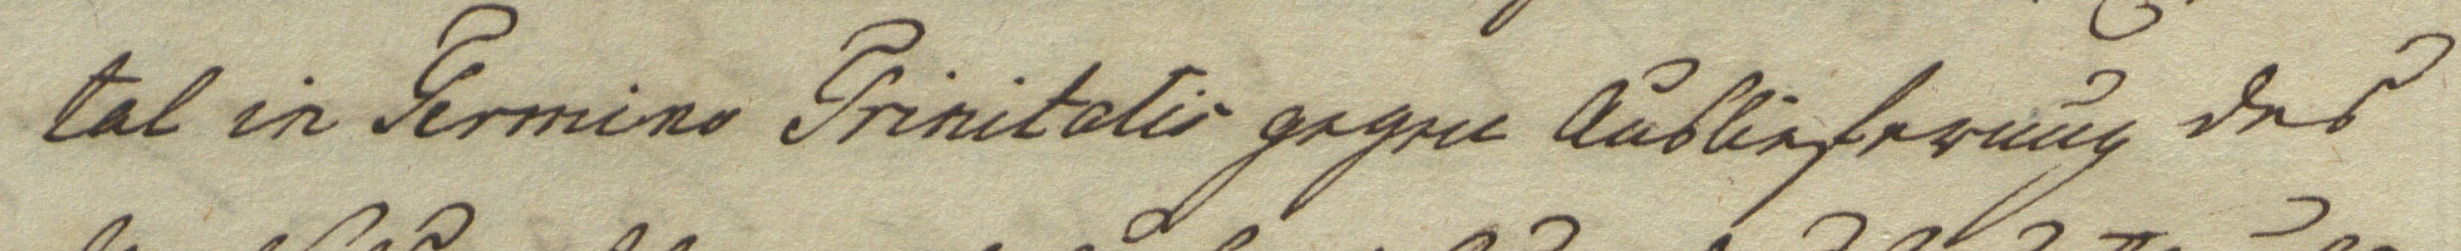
tal in Termino Trinitatis gegen Auslieferung des
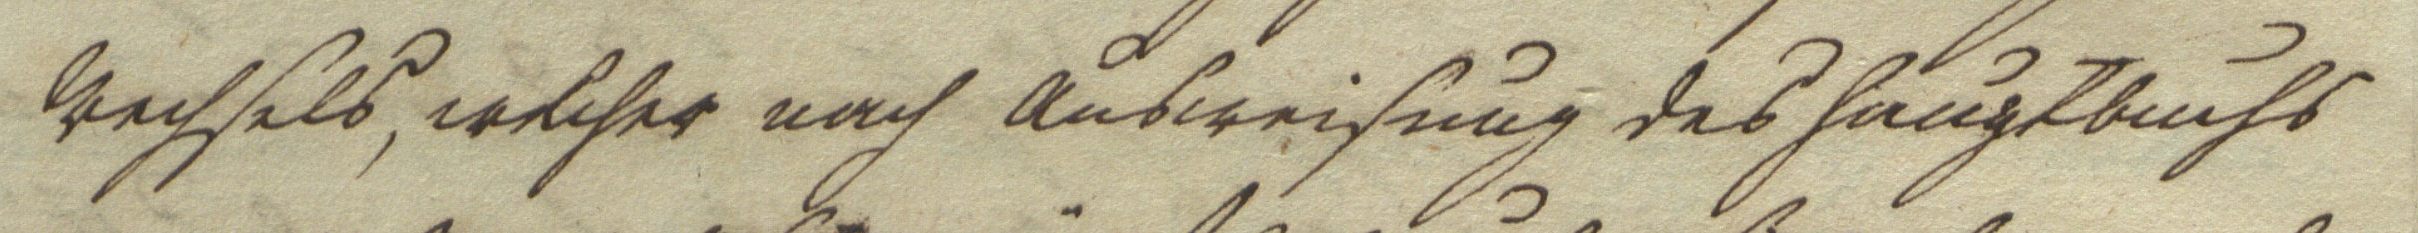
Wechsels, welcher nach Ausweisung des Hauptbuchs
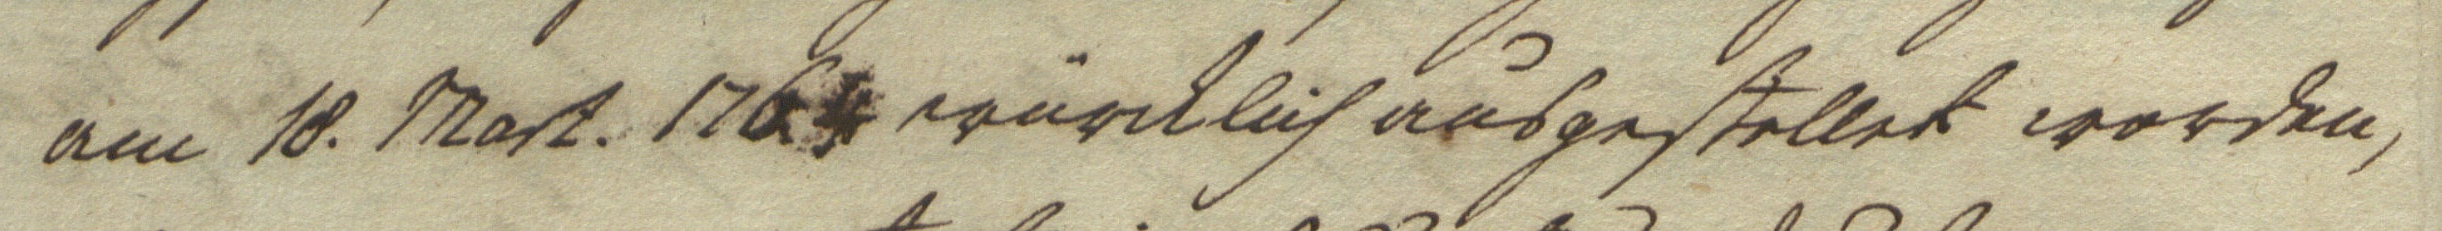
am 18. Mart. 1764 würklich ausgestellet worden,
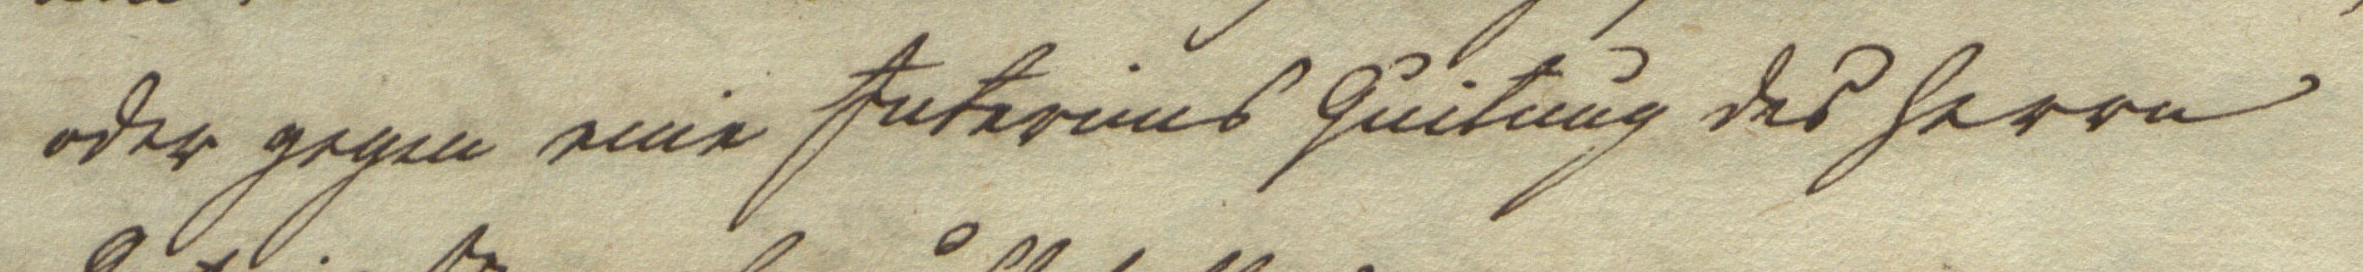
oder gegen eine interims Quitung des Herrn
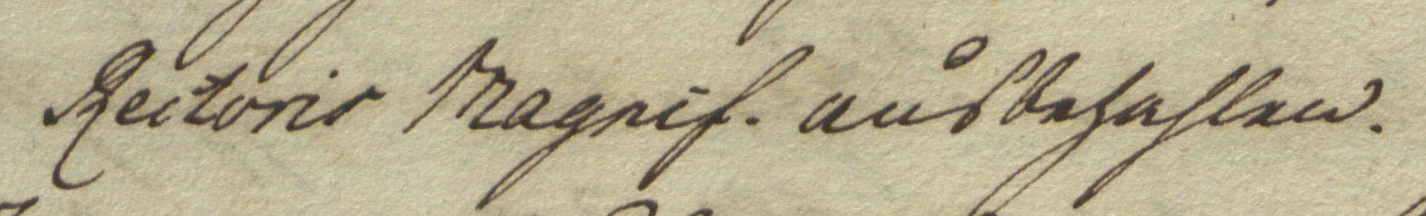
Rectoris Magnif. ausbezahlen.
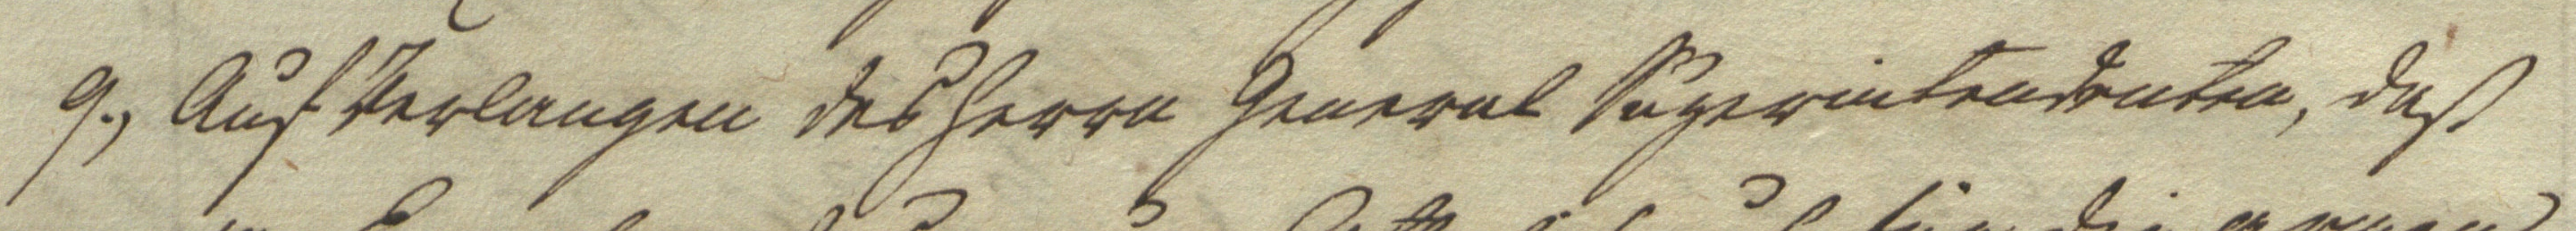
9., Auf Verlangen des Herrn General Superintendenten, daß
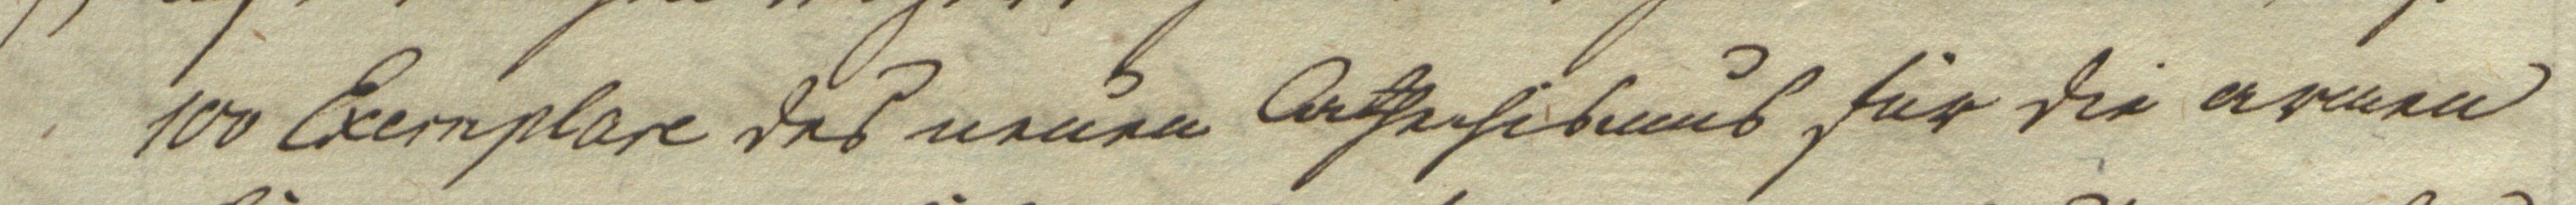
100 Exemplare des neuen Cathechismus für die armen
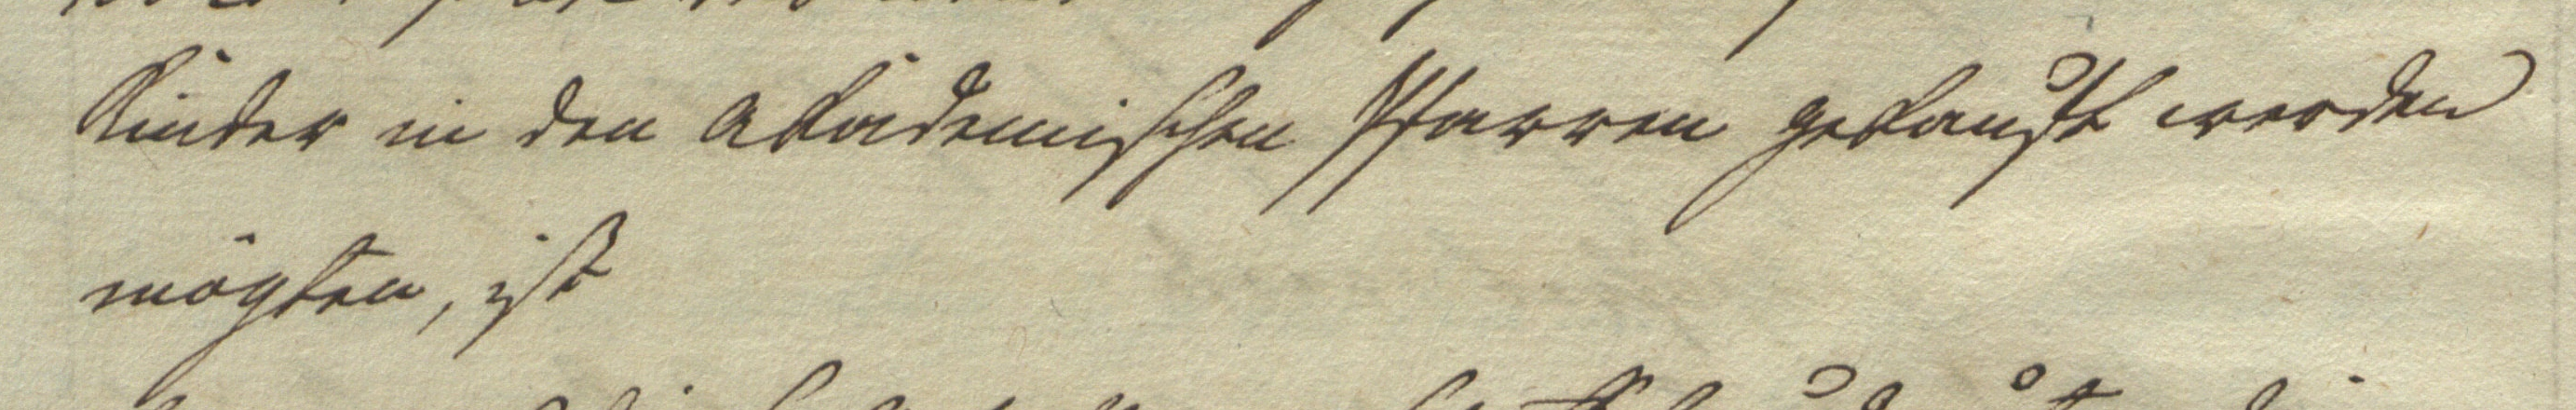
Kinder in den akademischen Pfarren gekauft werden
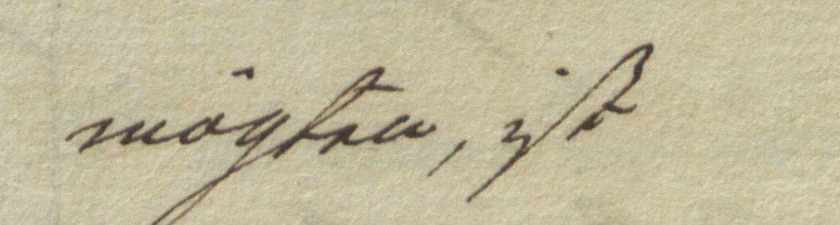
mögten, ist
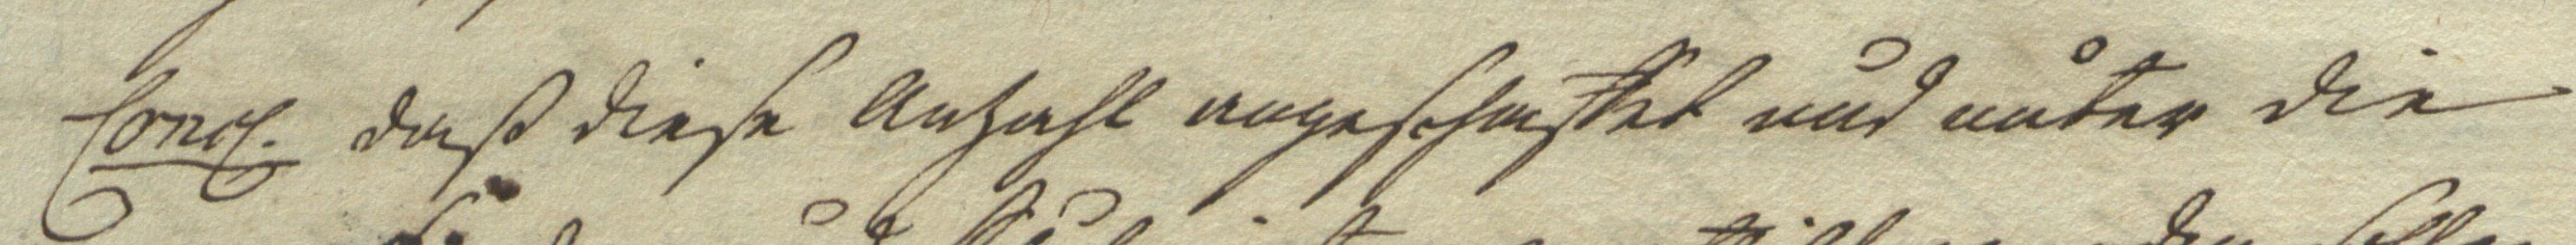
Concl. daß diese Anzahl angeschaffet und unter die
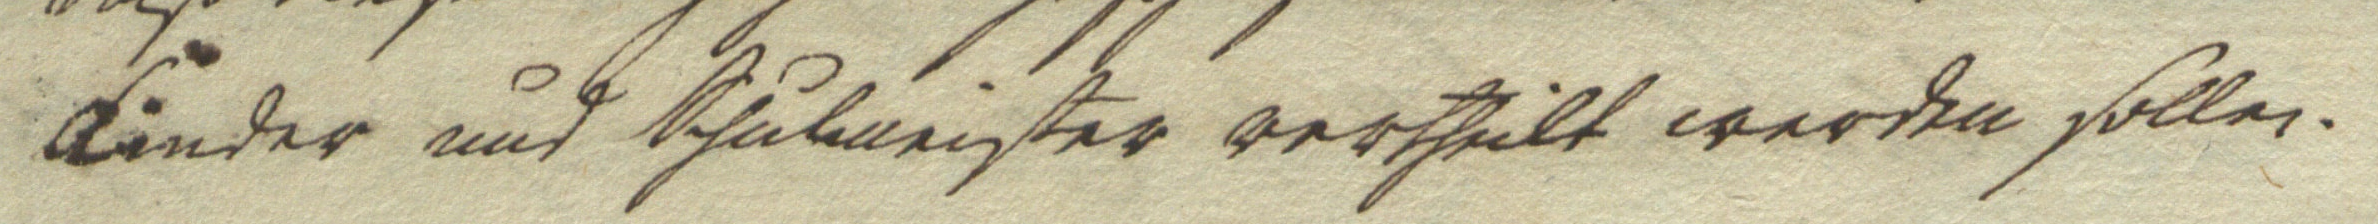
Kinder und Schulmeister vertheilt werden solle.
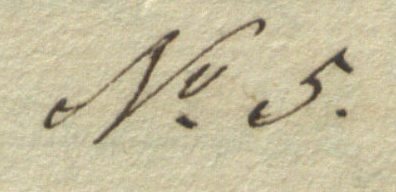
No. 5
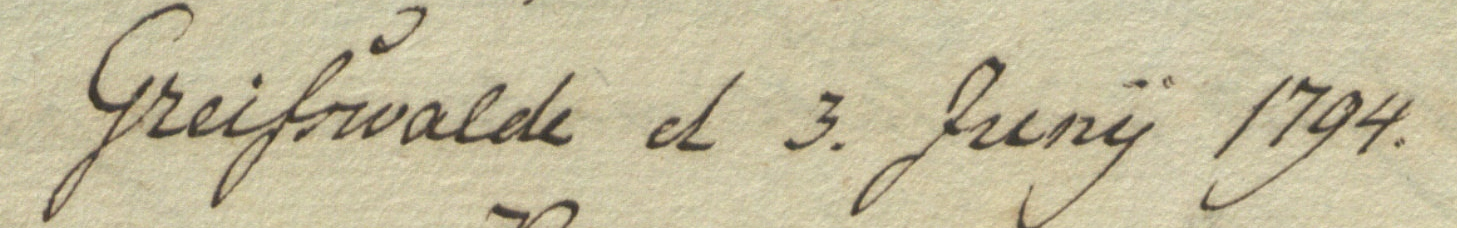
Greifswalde d 3. Juny 1794
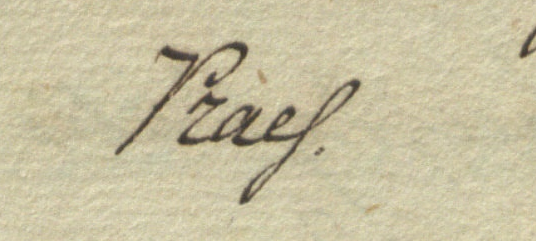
Praes.
